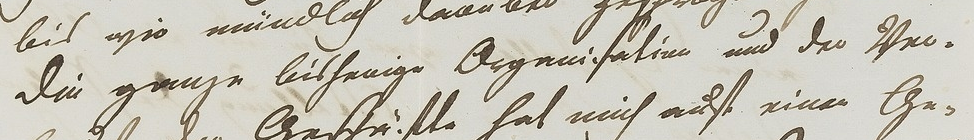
Die ganze bisherige Organisation und der Ver-
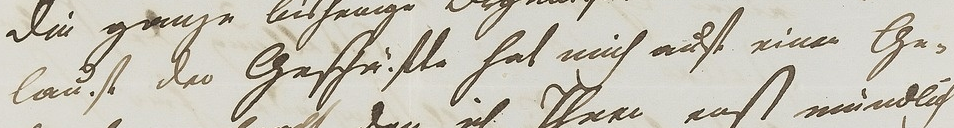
lauf der Geschäfte hat mich auf einen Ge-
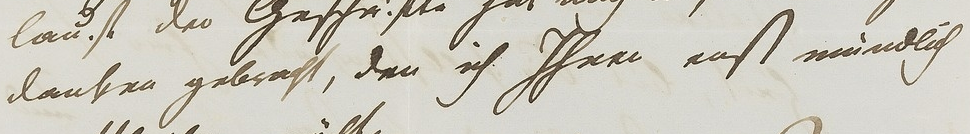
danken gebracht, den ich Ihnen erst mündlich
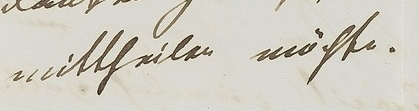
mittheilen möchte.
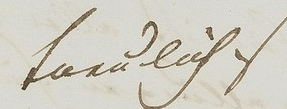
treulichst
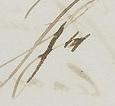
Ihr
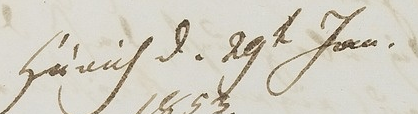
Zürich d. 29t Jan.
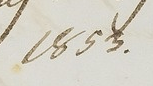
1853.
